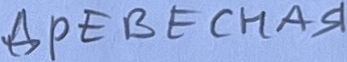древесная
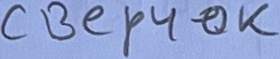сверчок
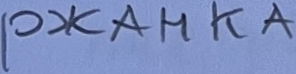ржанка
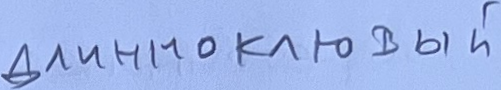длинноклювый
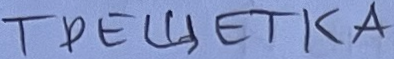трещетка
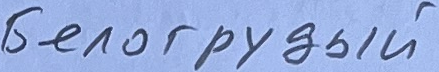белогрудый
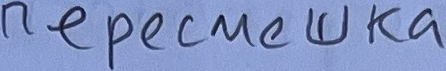пересмешка
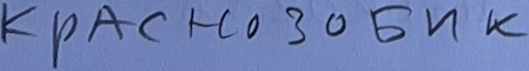краснозобик
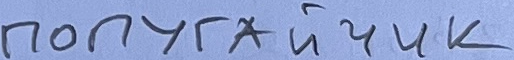попугайчик
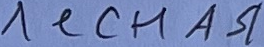лесная
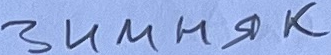зимняк
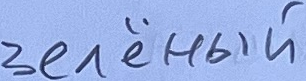зелёный
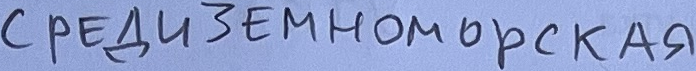средиземноморская
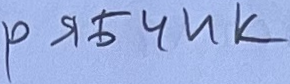рябчик
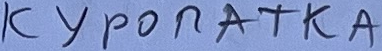куропатка
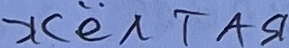жёлтая
